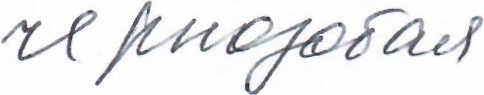чернозобая
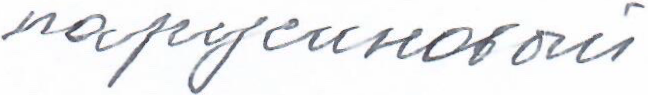парусиновый
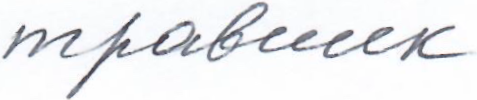травник
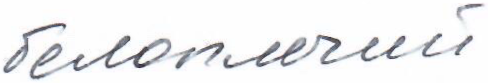белоплечий
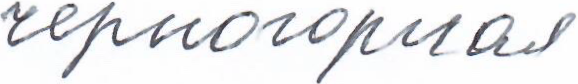черногорлая
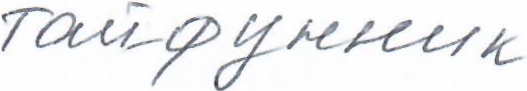тайфунник
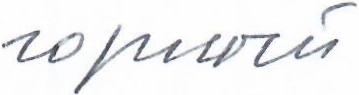горный
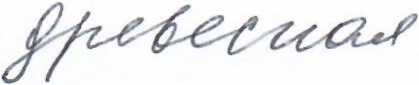древесная
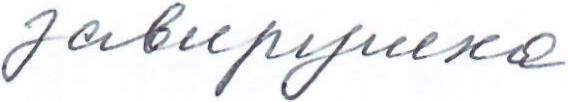завирушка
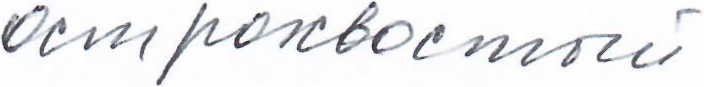острохвостый
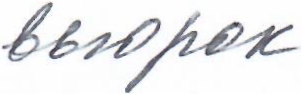вьюрок
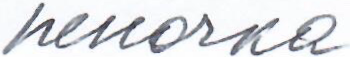пеночка
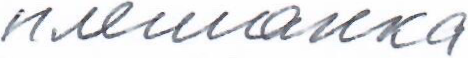плешанка
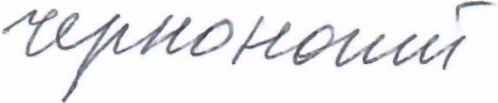черноногий
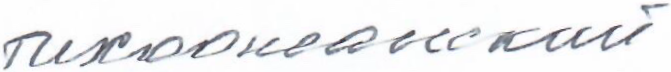тихоокеанский
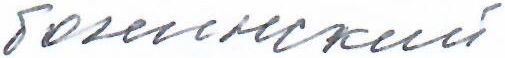бонинский
